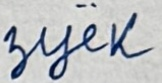зуёк
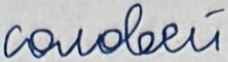соловей
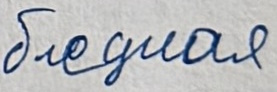бледная
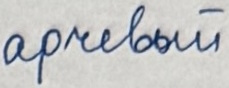арчевый
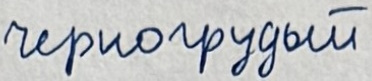черногрудый
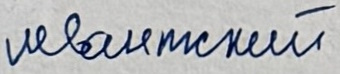левантский
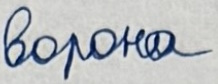ворона
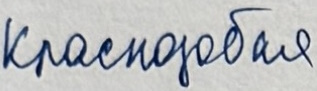краснозобая
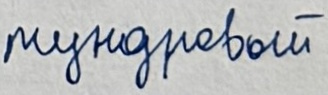тундровый
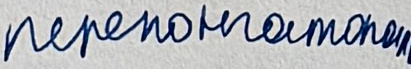перепончатопал
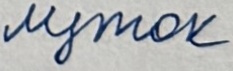луток
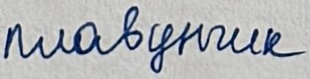плавунчик
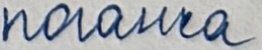поганка
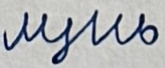лунь
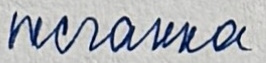песчанка
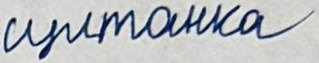султанка
